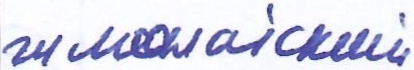гималайский
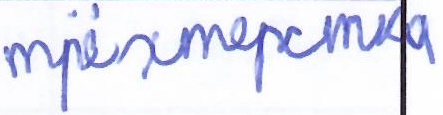трёхтерстка
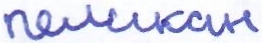пеликан
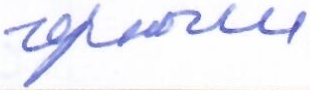черныш
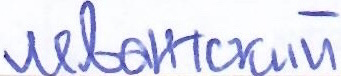левантский
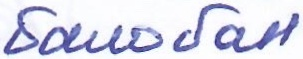балобан
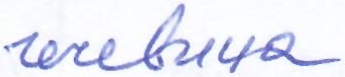чечевица
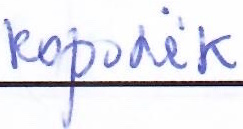королёк
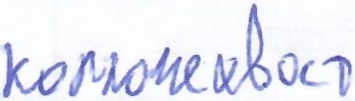колючехвост
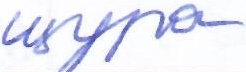щура
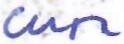сип
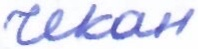чекан
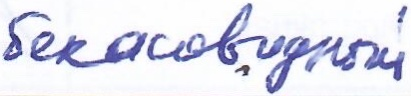бекасовидный
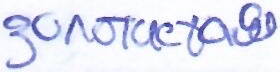золотистая
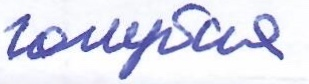голубая
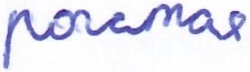рогатая
